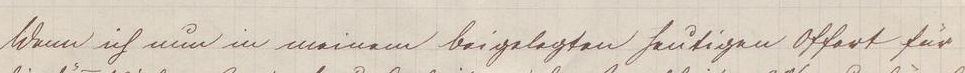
Wenn ich nun in meinem beigelegten heutigen Offert für
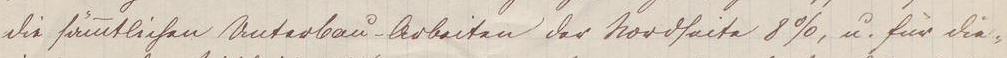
die sämmtlichen Unterbau-Arbeiten der Nordseite 8%, u. für die-
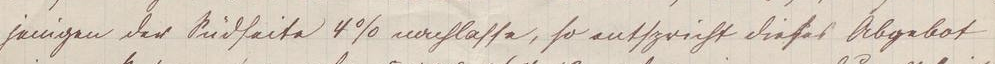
jenigen der Südseite 4% nachlasse, so entspricht dieses Abgebot
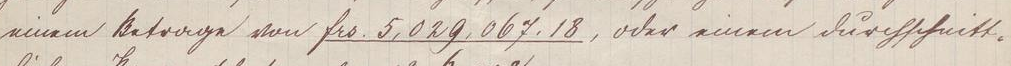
einem Betrage von frs. 5,029,067.18, oder einem durchschnitt-
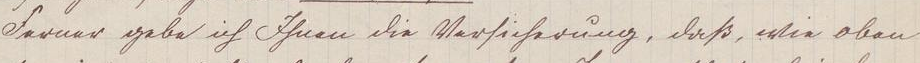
Ferner gebe ich Ihnen die Versicherung, daß, wie oben
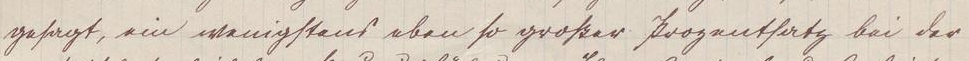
gesagt, ein wenigstens eben so großer Prozentsatz bei der
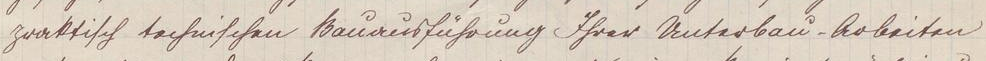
praktisch technischen Bauausführung Ihrer Unterbau-Arbeiten
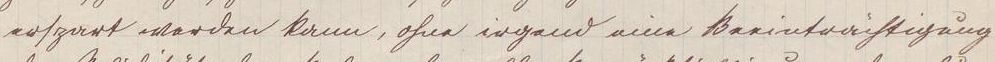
erspart werden kann, ohne irgend eine Beeinträchtigung
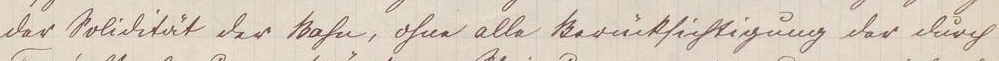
der Solidität der Bahn, ohne alle Berücksichtigung der durch
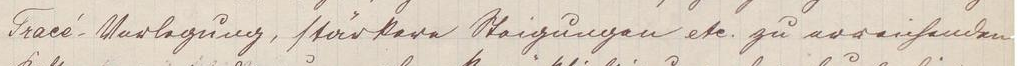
Tracé-Verlegung, stärkere Steigungen etc. zu erreichenden
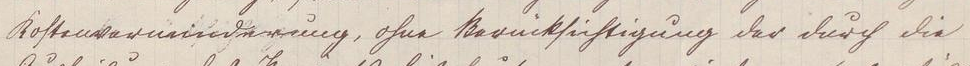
Kostenverminderung, ohne Berücksichtigung der durch die
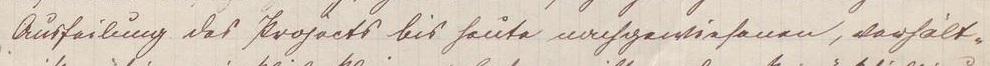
Ausfeilung des Projects bis heute nachgewiesenen, verhält-
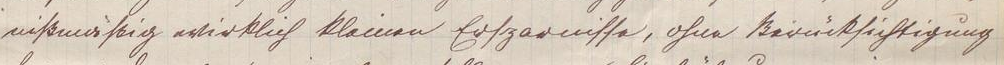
nißmäßig wirklich kleinen Ersparnisse, ohne Berücksichtigung
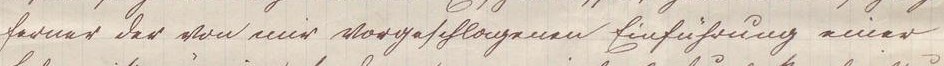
ferner der von mir vorgeschlagenen Einführung einer
